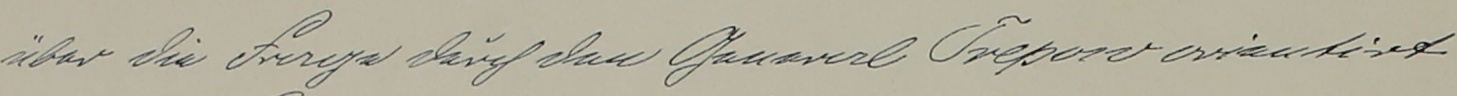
über die Frage durch den General Trepow orientirt
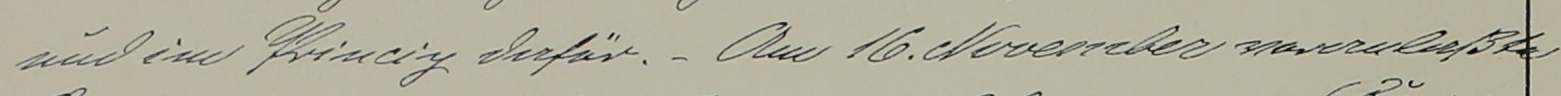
und im Princip dafür. – Am 16. November veranlaßte
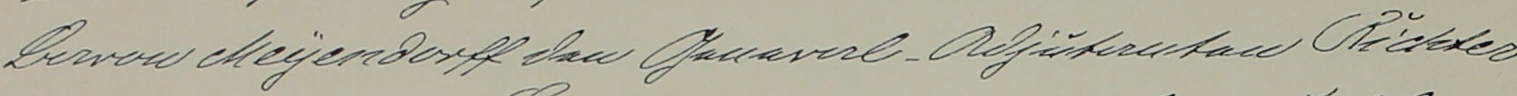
Baron Meyendorff den General-Adjutanten Richter
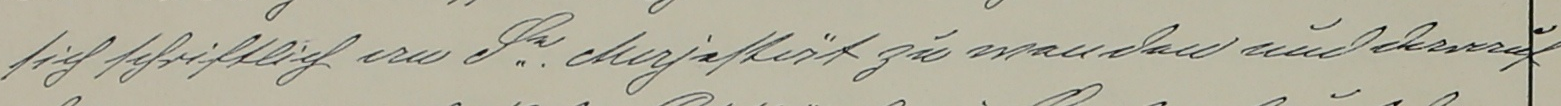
sich schriftlich an Se. Majestät zu wenden und darauf
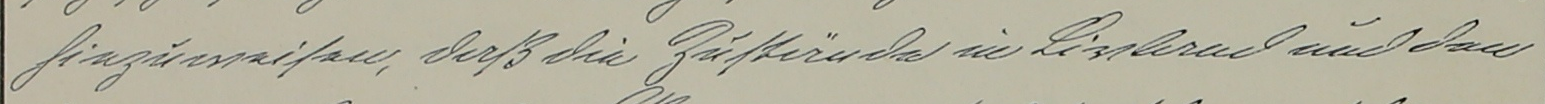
hinzuweisen, daß die Zustände in Livland und den
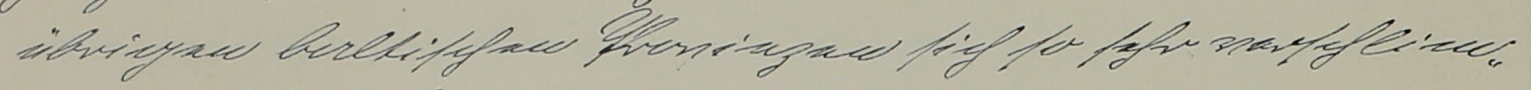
übrigen baltischen Provinzen sich so sehr verschlim-
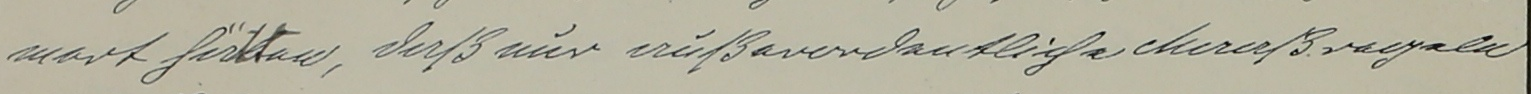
mert hätten, daß nur außerordentliche Maaßregeln
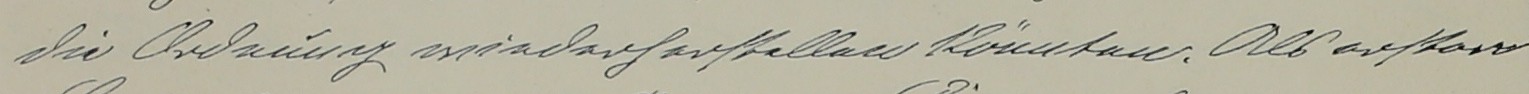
die Ordnung wiederherstellen könnten. Als ersten
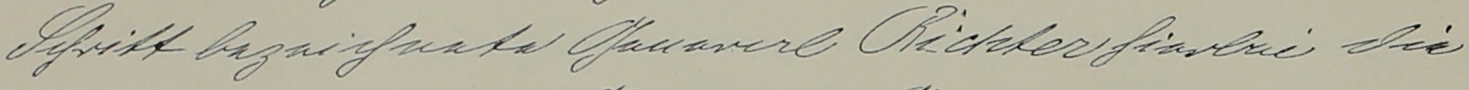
Schritt bezeichnete General Richter hierbei die
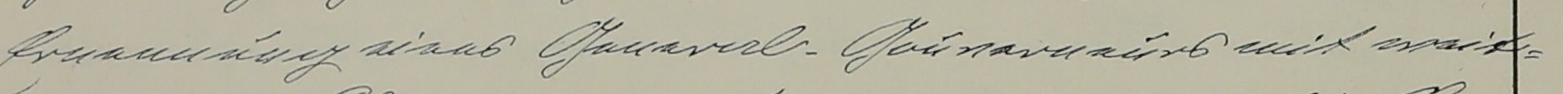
Ernennung eines General-Gouverneurs mit weit-
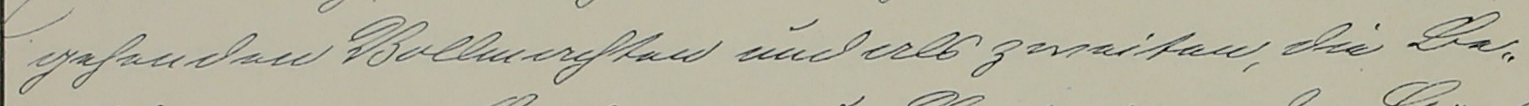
gehenden Vollmachten und als zweiten, die Be-
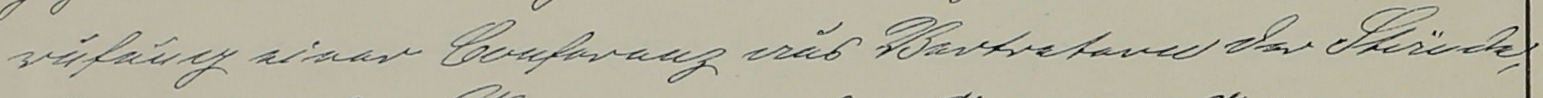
rufung einer Conferenz aus Vertretern der Stände,
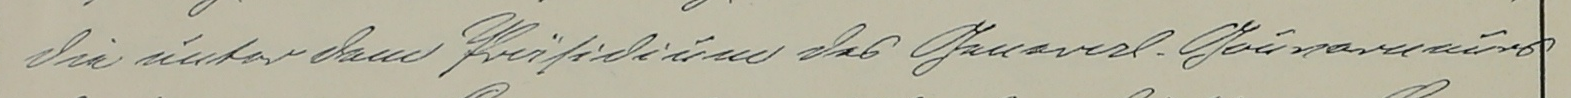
die unter dem Präsidium des General-Gouverneurs
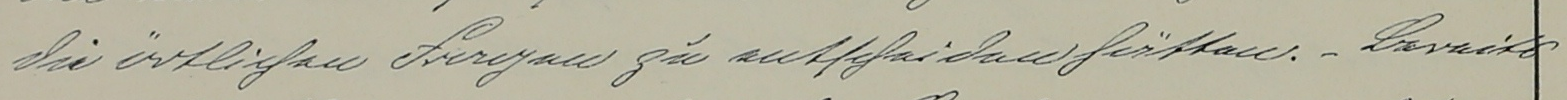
die örtlichen Fragen zu entscheiden hätten. – Bereits
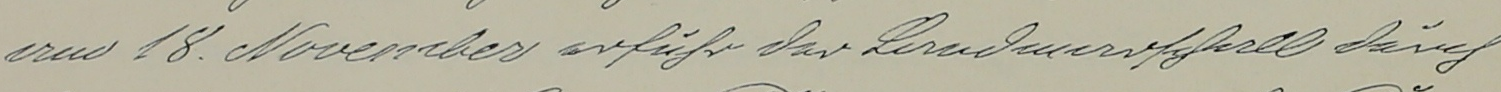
am 18. November erfuhr der Landmarschall durch
